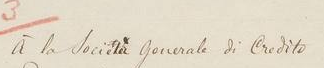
À la Società Generale di Credito
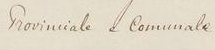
Provinciale e Comunale
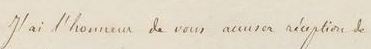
J'ai l'honneur de vous accuser réception de
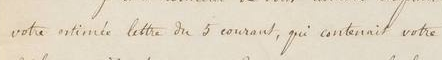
votre estimée lettre du 5 courant, qui contenait votre
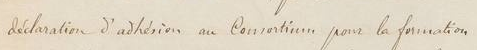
déclaration d'adhésion au Consortium pour la formation
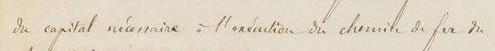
du capital nécessaire à l'exécution du chemin de fer du
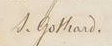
S. Gothard.
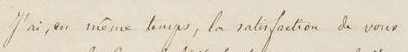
J'ai, en même temps, la satisfaction de vous
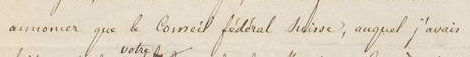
annoncer que le Conseil fédéral Suisse, auquel j'avais
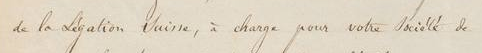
de la Légation Suisse, à charge pour votre Société de
